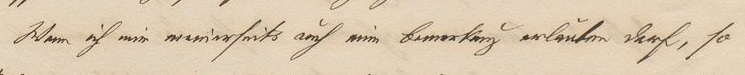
Wenn ich mir meinerseits auch eine Bemerkung erläutern darf, so
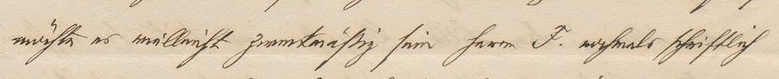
möchte es vielleicht zweckmässig Herrn F. nochmals schriftlich
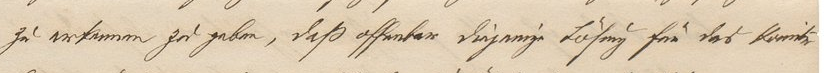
zu erkennen zu geben, daß offenbar diejenige Lösung für das Komite
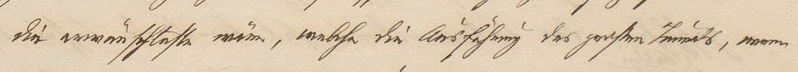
die erwünschteste wäre, welche die Ausführung des großen Tunnels, wenn
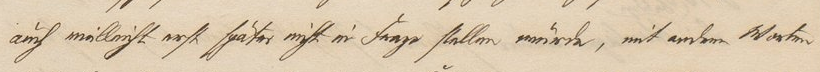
auch vielleicht erst später nicht in Frage stellen würde, mit andern Worten
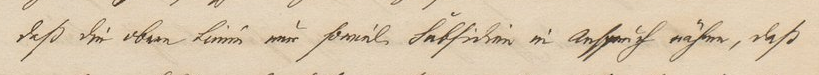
daß die obere Linie nur soviel Subsidien in Anspruch nähme, daß
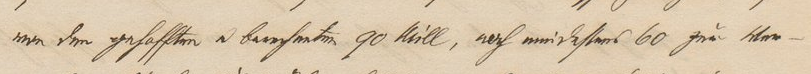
von den gehofften u berechneten 90 Mill, noch mindestens 60 zur Ver-
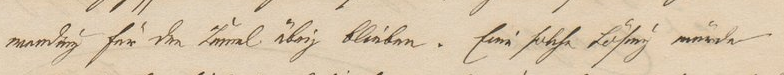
wendung für den Tunnel übrig blieben. Eine solche Lösung würde
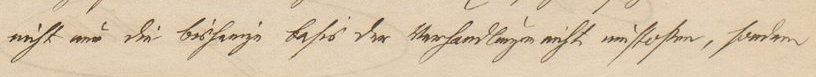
nicht nur die bisherige Basis der Verhandlungen nicht umstoßen, sondern
